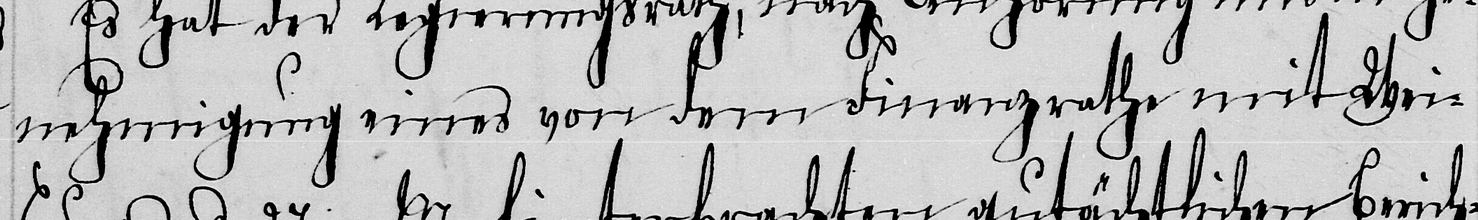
nehmigung eines von dem Finanzrathe mit Wei¬
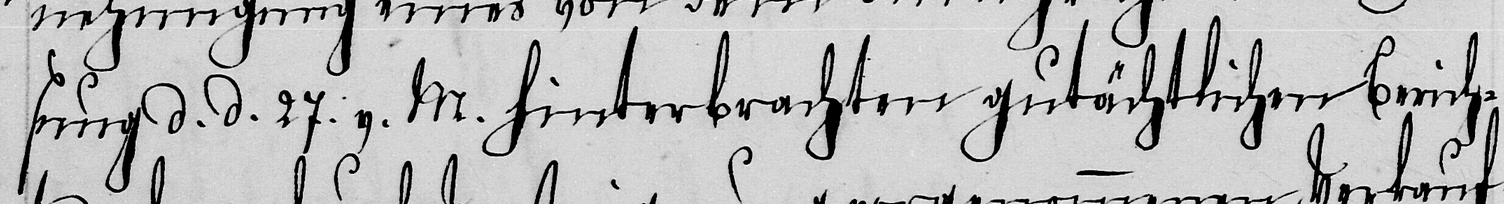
sung d. d. 27. v. M. hinterbrachten gutächtlichen Beric¬
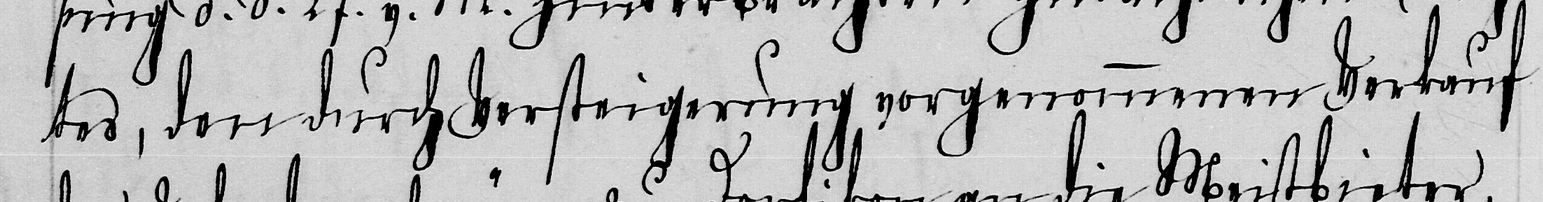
hten, den durch Versteigerung vorgenommenen Verkauf
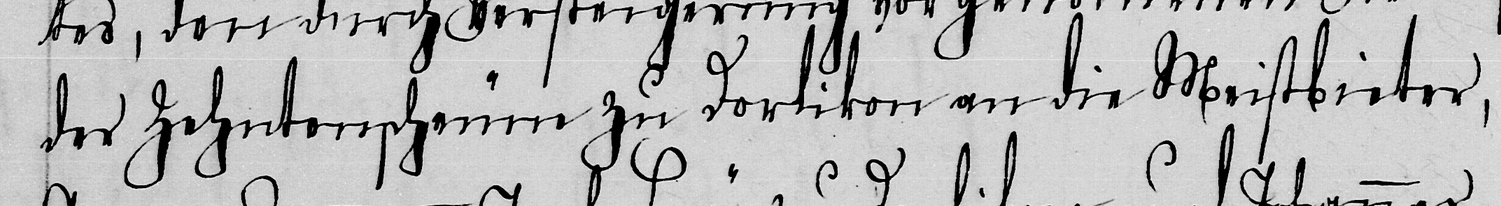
der Zehntenscheune zu Dortikon an die Meistbieter,
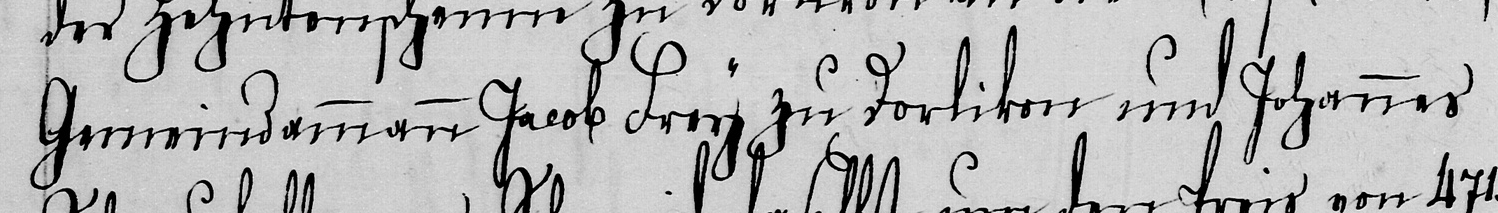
Gemeindsammann Jacob Frey zu Dorlikon und Johannes
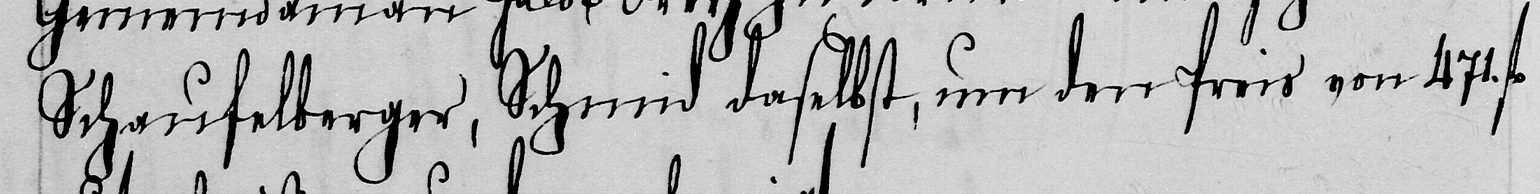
Schaufelberger, Schmid daselbst, um den Preis von 471.
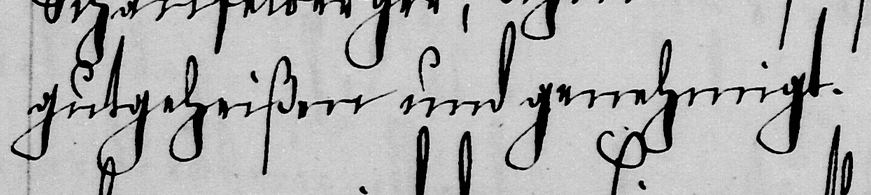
gutgeheißen und genehmigt.
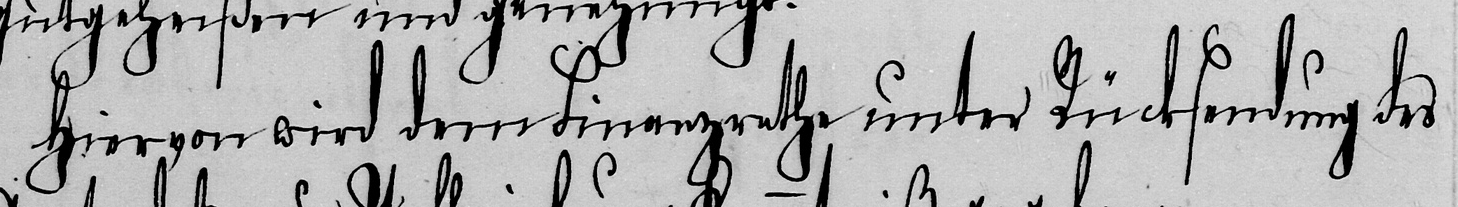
Hiervon wird dem Finanzrathe unter Rücksendung des
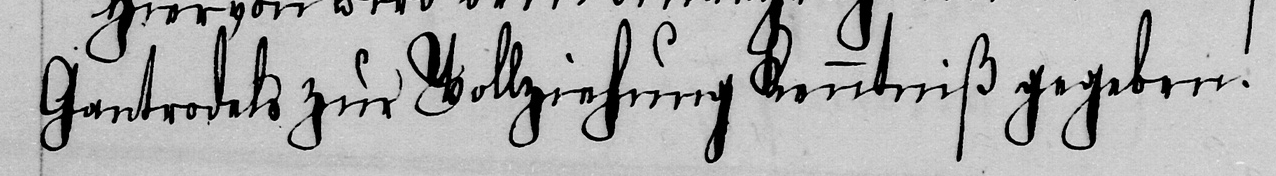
Gantrodels zur Vollziehung Kenntniß gegeben.
